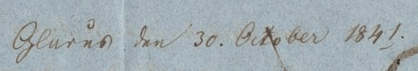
Glarus den 30. October 1841.
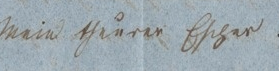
Mein theurer Escher!
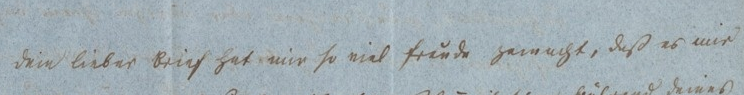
Dein lieber Brief hat mir so viel Freude gemacht, daß es mir
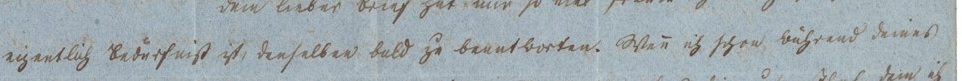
eigentlich Bedürfniß ist, denselben bald zu beantworten. Wenn ich schon während deines
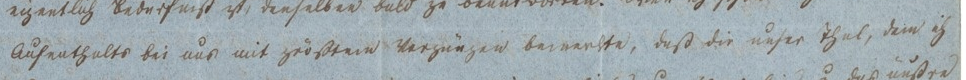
Aufenthaltes bei uns mit größtem Vergnügen bemerkte, daß dir unser Thal, dem ich
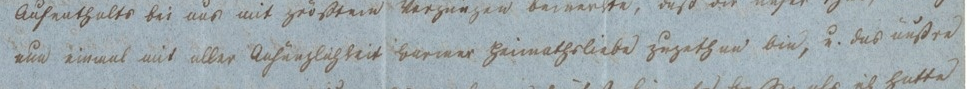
nun einmal mit aller Anhänglichkeit warmer Heimathsliebe zugethan bin, u. das äußre
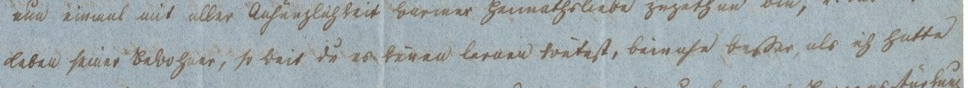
Leben seiner Bewohner, so weit du es kennen lernen konntest, beinahe besser, als ich hatte
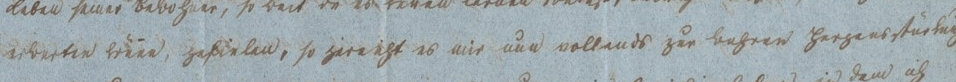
erwarten können, gefielen, so gereicht es mir nun vollends zur wahren Herzensstärkung,
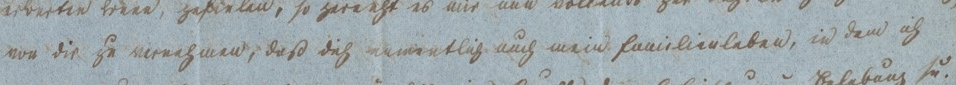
von dir zu vernehmen, daß dich namentlich auch mein Familienleben, in dem ich
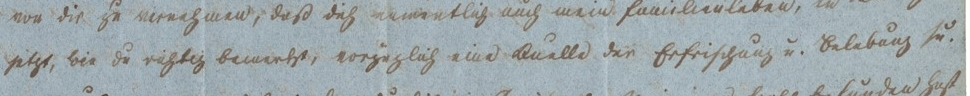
jetzt, wie du richtig bemerkst, vorzüglich eine Quelle der Erfrischung u. Belebung su-
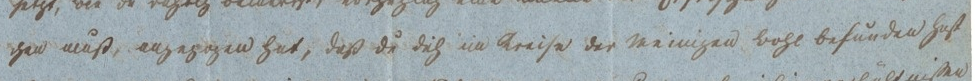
chen muß, angezogen hat, daß du dich im Kreise der Meinigen wohl befunden hast.
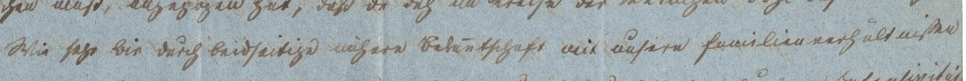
Wie sehr wir durch beidseitige nähere Bekanntschaft mit unsern Familienverhältnissen
